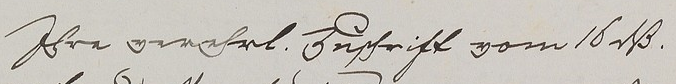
Ihre verehrl. Zuschrift vom 16. dß.
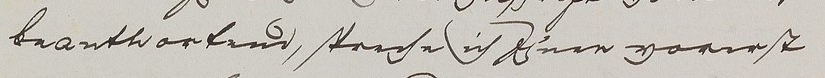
beantwortend, spreche ich Ihnen vorerst
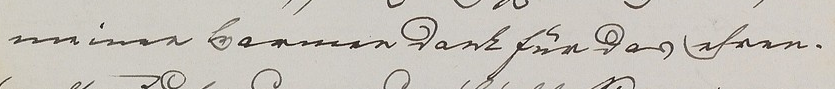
meinen warmen Dank für das ehren-
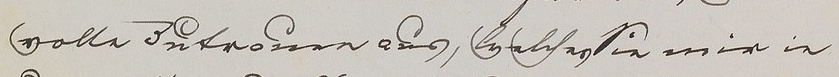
volle Zutrauen aus, welches Sie mir in
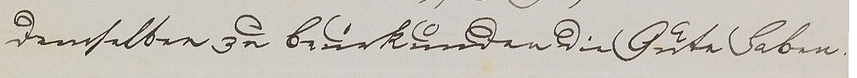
demselben zu beurkunden die Güte haben.
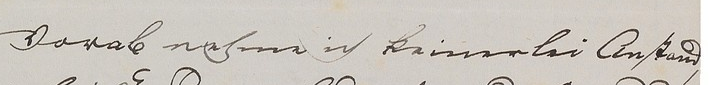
Vorab nehme ich keinerlei Anstand,
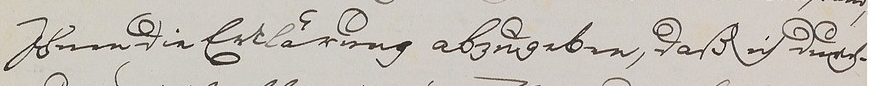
Ihnen die Erklärung abzugeben, daß ich durch-
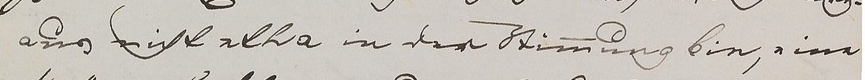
aus nicht etwa in der Stimmung bin, eine
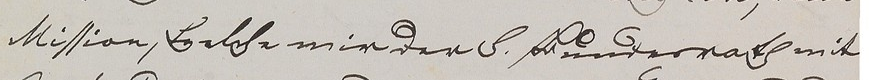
Mission, welche mir der H. Bundesrath mit
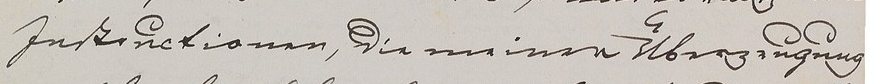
Instructionen, die meiner Überzeugung
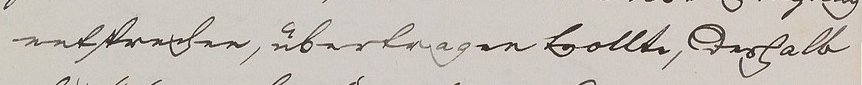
entsprechen, übertragen wollte, deshalb
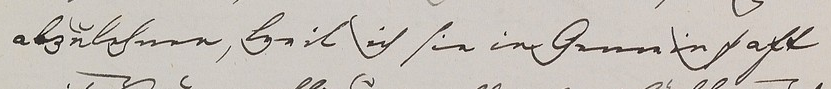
abzulehnen, weil ich sie in Gemeinschaft
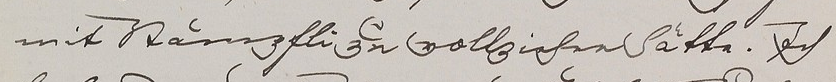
mit Stämpfli zu vollziehen hätte. Ich
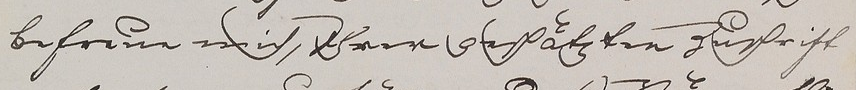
befreue mich, Ihrer geschätzten Zuschrift
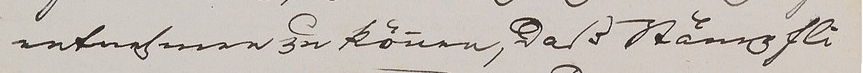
entnehmen zu können, daß Stämpfli
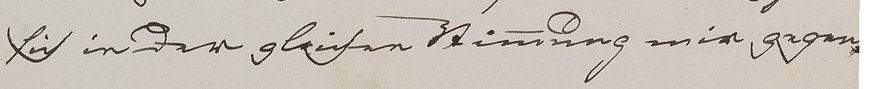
sich in der gleichen Stimmung mir gegen-
